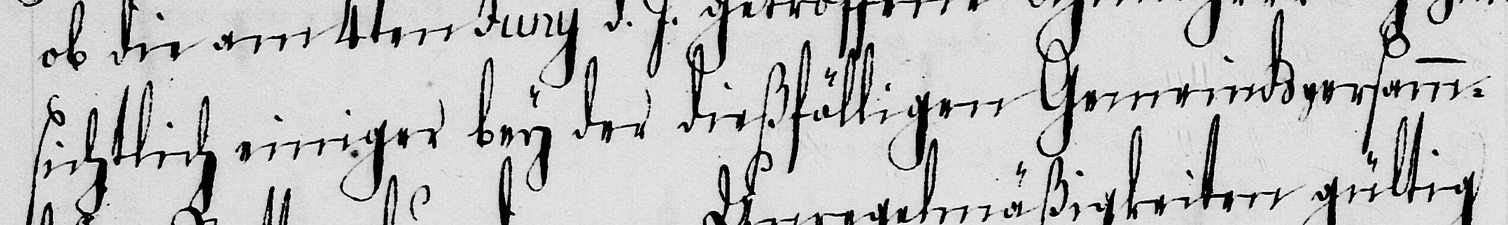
nsichtlich einiger bey der dießfälligen Gemeindsversamm¬
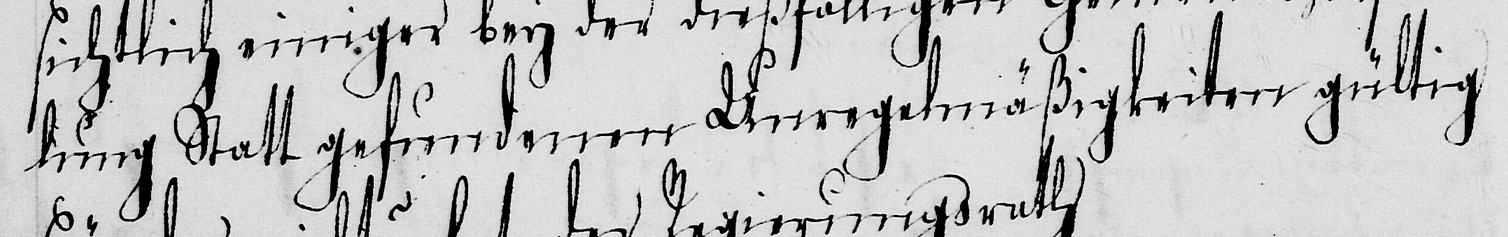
lung Statt gefundenen Unregelmäßigkeiten gültig
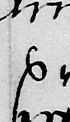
l.
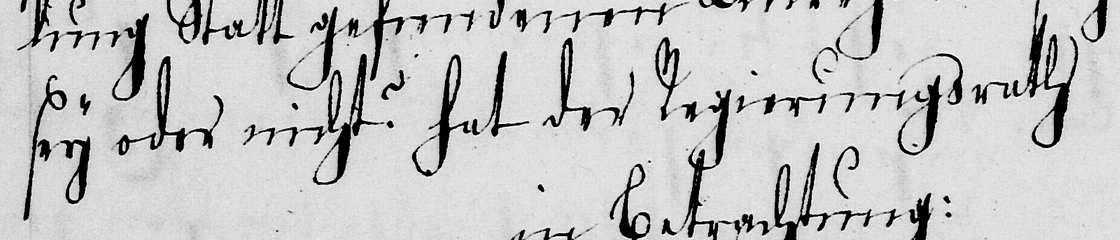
sey oder nicht? hat der Regierungsrath
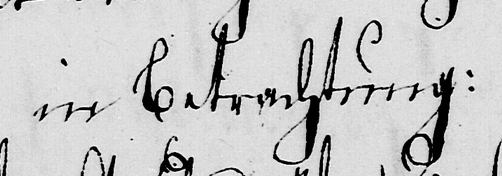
in Betrachtung:
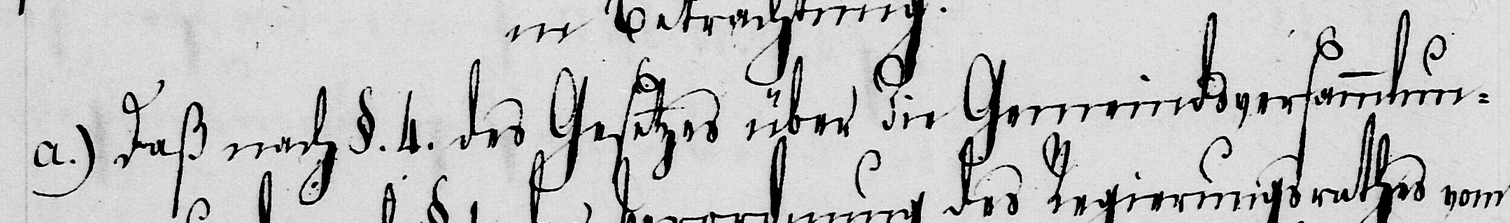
a.) Daß nach §. 4. des Gesetzes über die Gemeindsversammlun¬
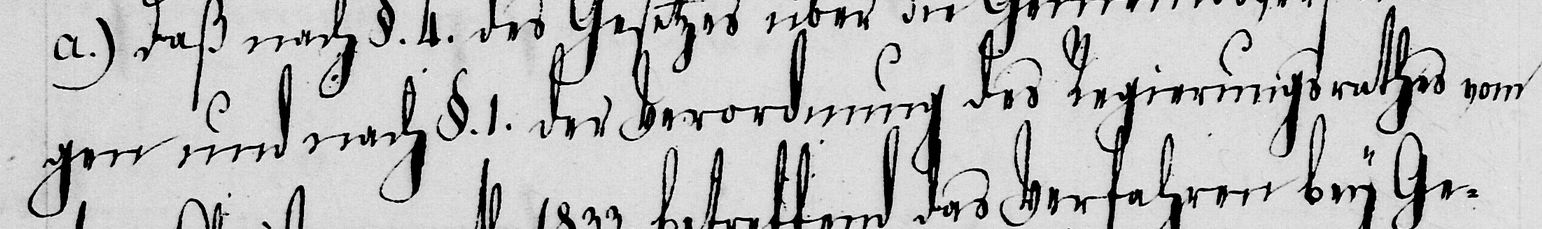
gen und nach §. 1. der Verordnung des Regierungsrathes vom
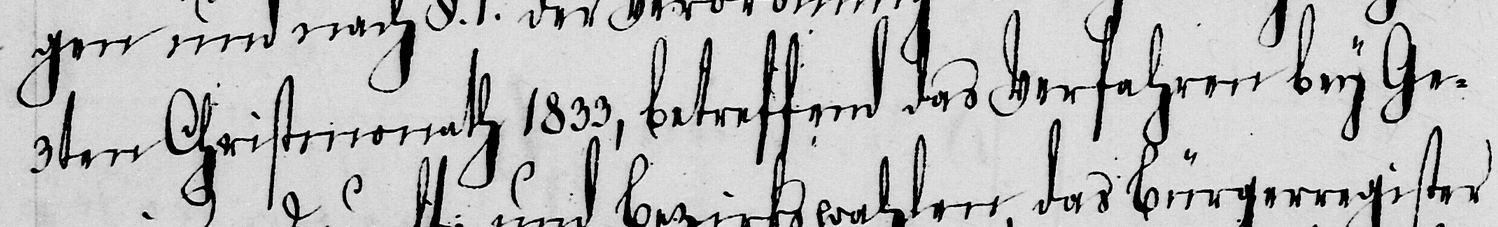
3ten Christmonath 1833, betreffend das Verfahren bey Ge¬
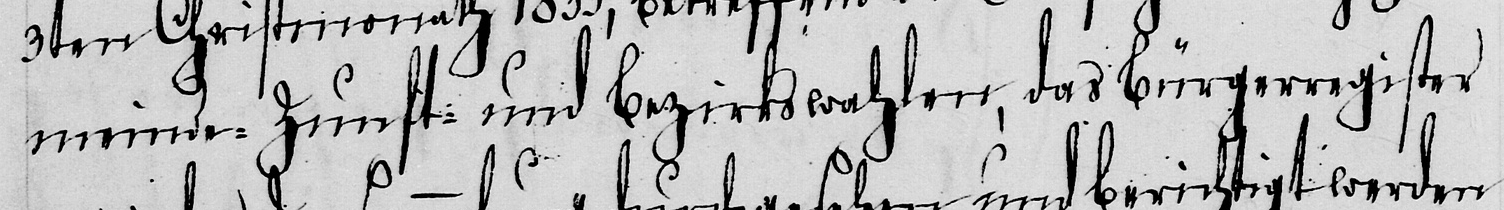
meinde- Zunft- und Bezirkswahlen, das Bürgerregister
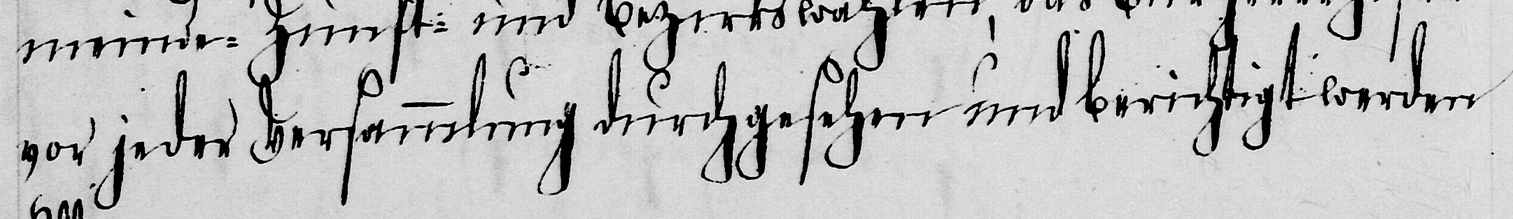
vor jeder Versammlung durchgesehen und berichtigt werden
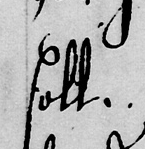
sol¬
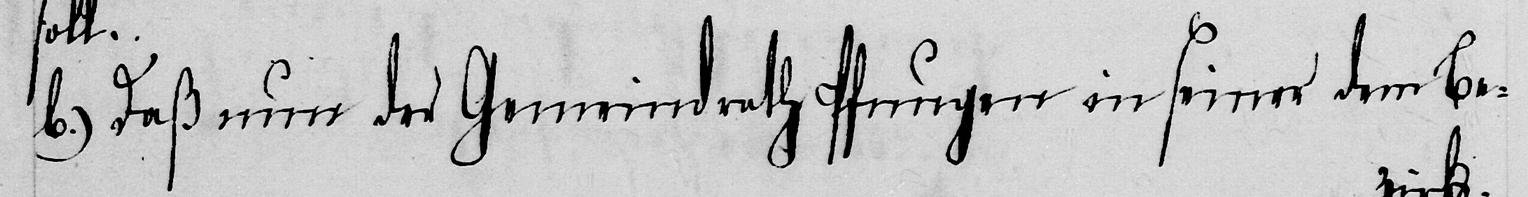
b.) Daß nun der Gemeindrath Pfungen in seiner dem Be-
